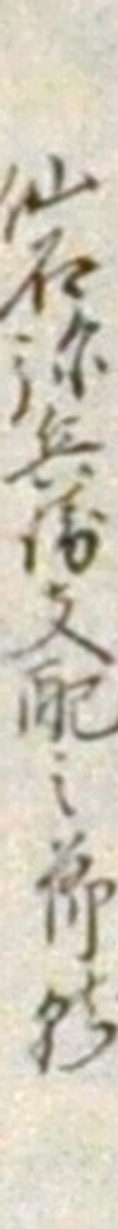仙石弥兵衛支配之節就
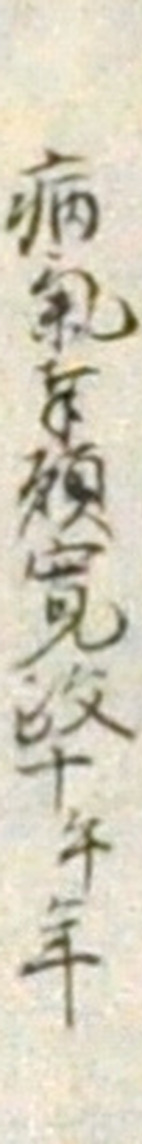病気奉願寛政十午年
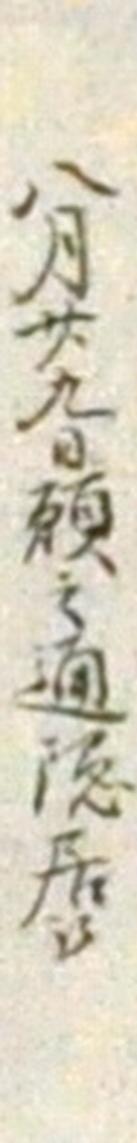八月廿九日願之通隠居被
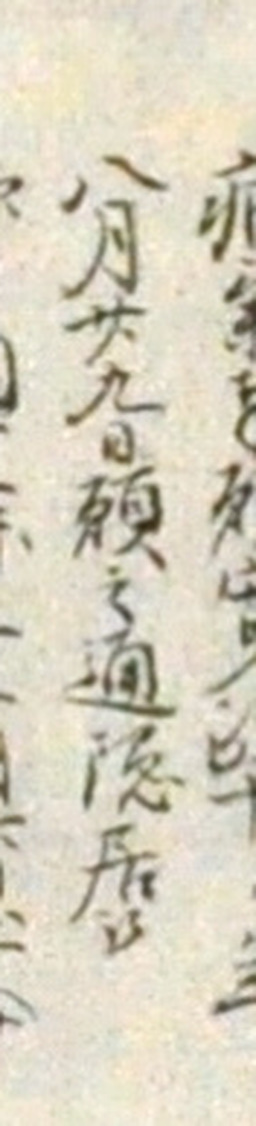八月廿九日願之通隠居被
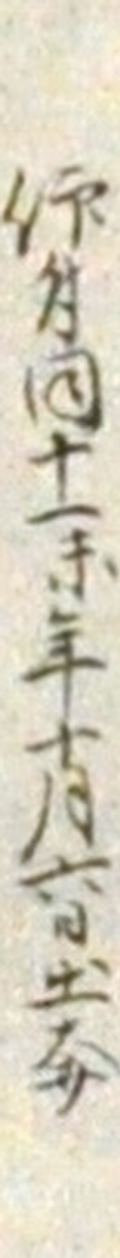仰付同十一未年十月六日出奔
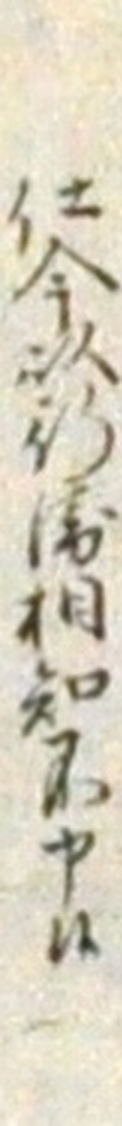仕今以行衛相知不申候
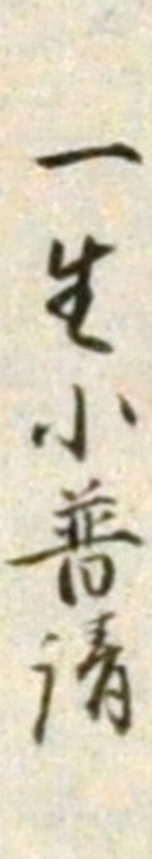一生小普請
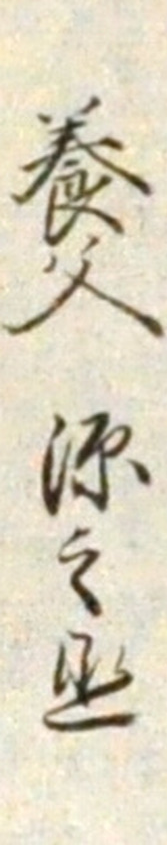養父源之丞
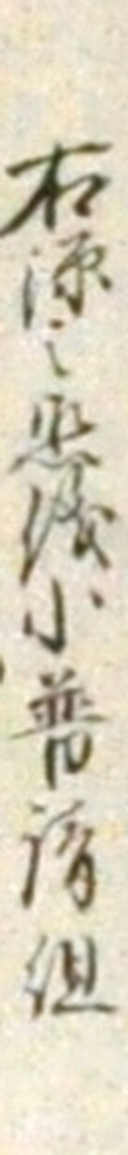右源之丞儀小普請組
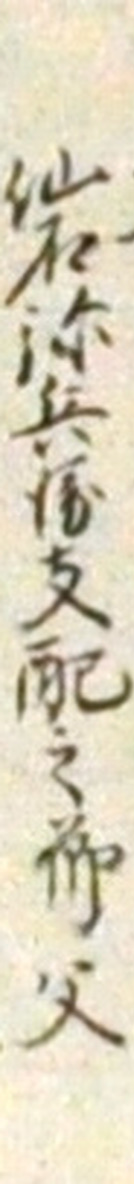仙石弥兵衛支配之節父
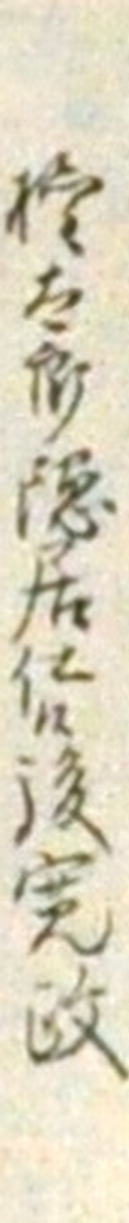権太郎隠居仕候後寛政
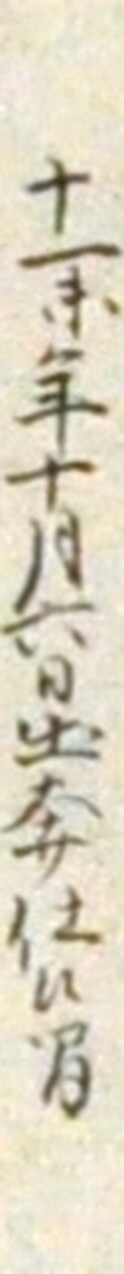十一未年十月六日出奔仕候間
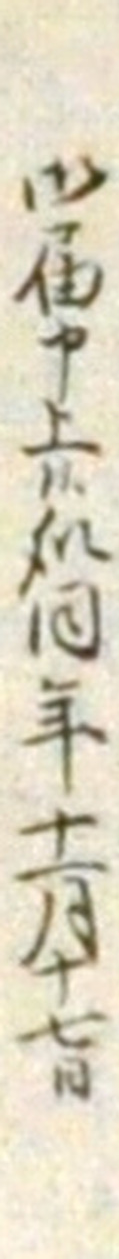御届申上候処同年十一月十七日
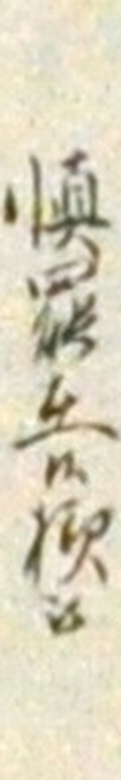慎罷在候様被
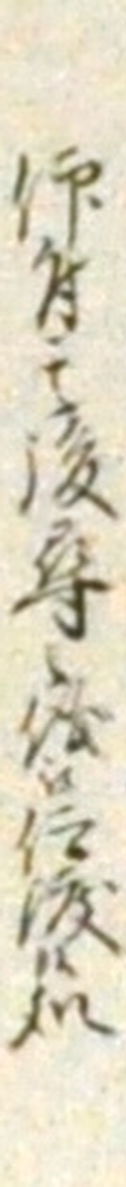仰付其後尋之儀被仰渡候処
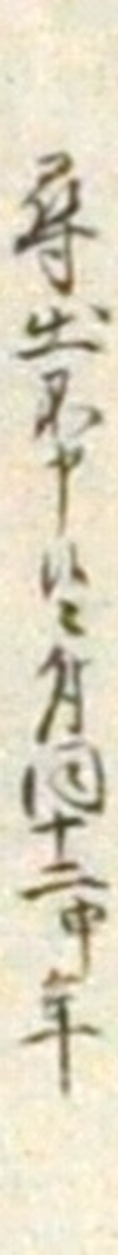尋出不申候ニ付同十二申年
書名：若年寄御役中御調書付
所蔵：伊那市立高遠町図書館・合同会社AMANE
